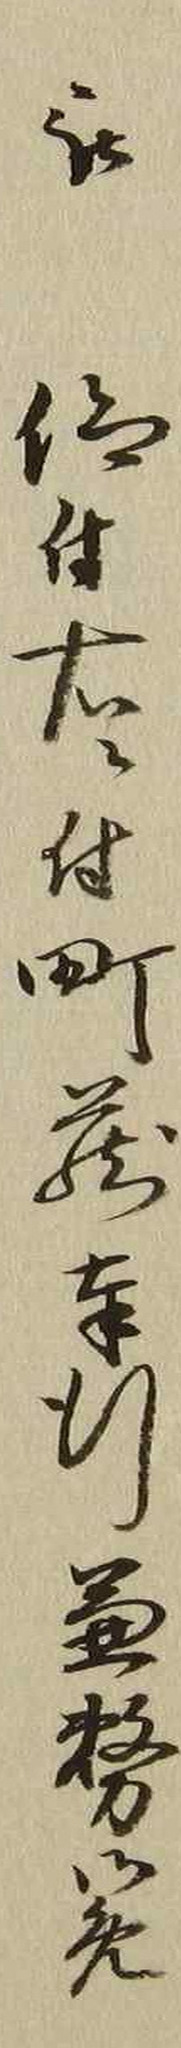被仰付右ニ付町蔵奉行兼務御免
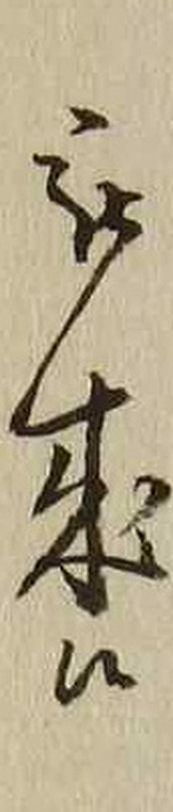被成候
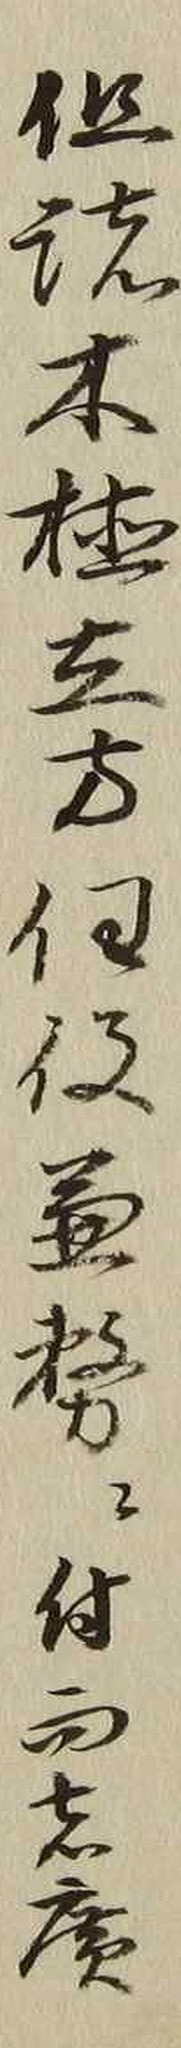但諸木植立方任役兼務ニ付而者広
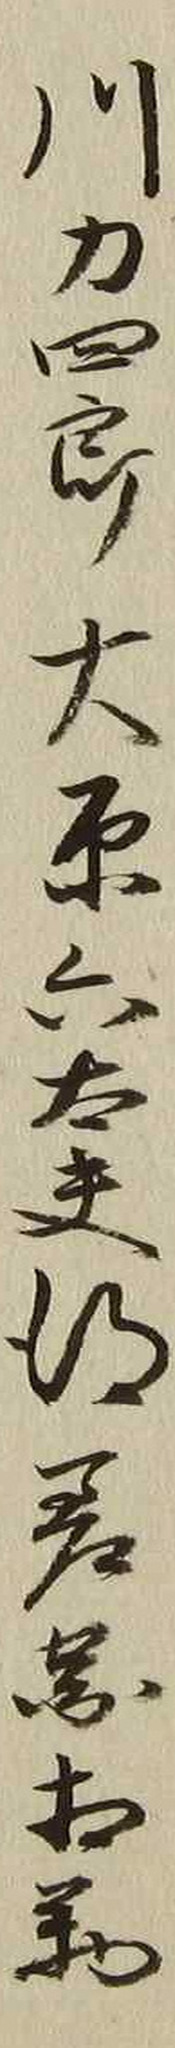川力四郎大原六太夫得差図相勤
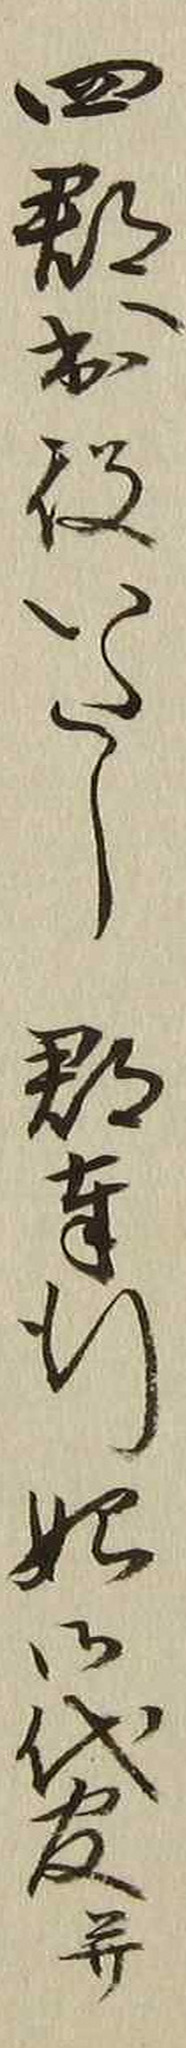四郡へ出役いたし郡奉行始御代官幷
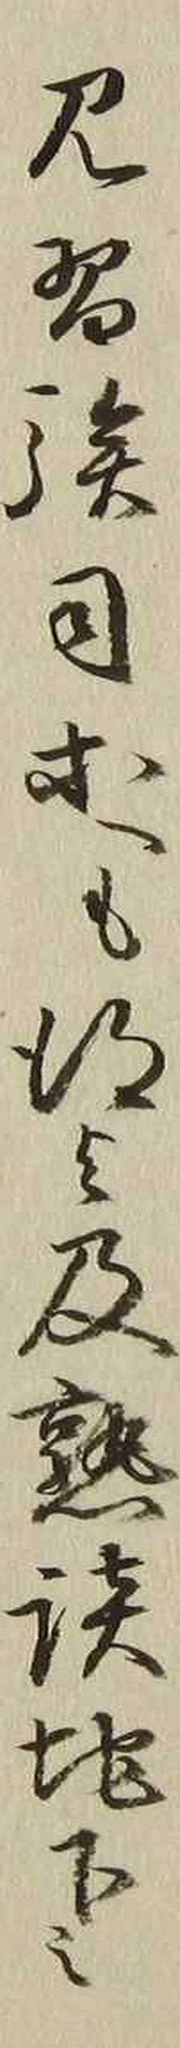見習族司等へも得与及熟談地下之
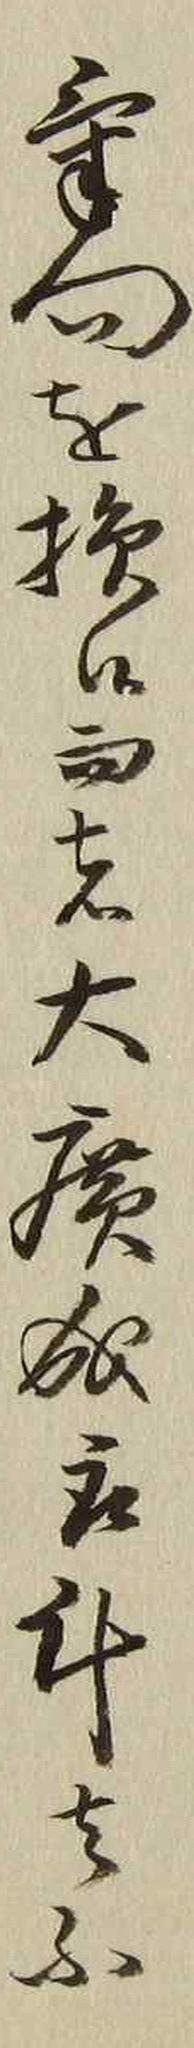気向を損候而者大広成取計者不
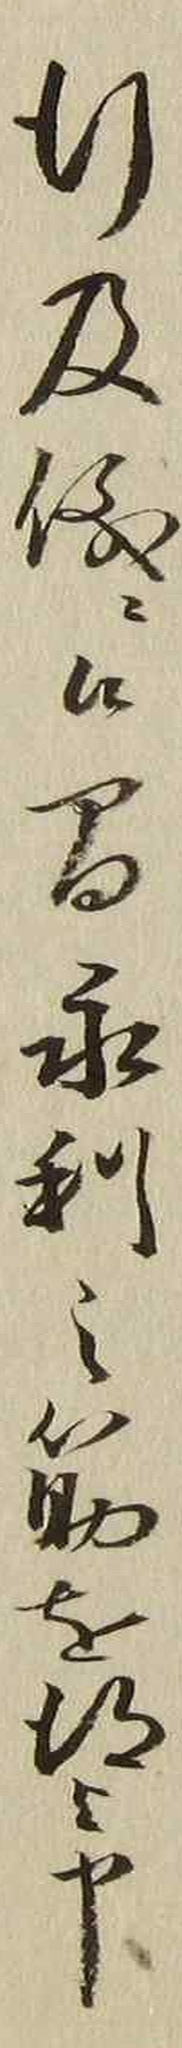行及儀ニ候間永利之筋を得与申
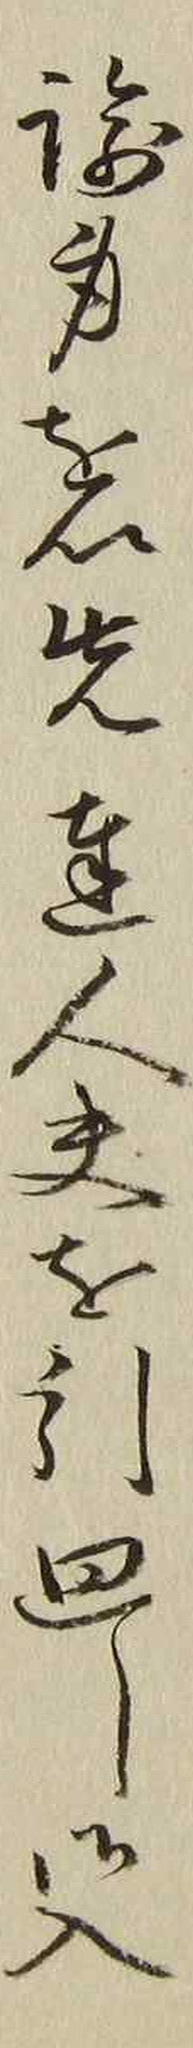諭身を以先達人夫を引廻し御入
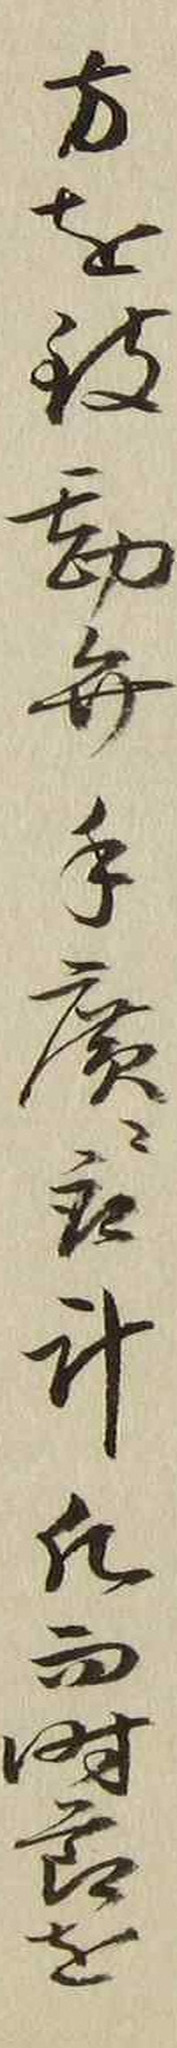方を致勘弁手広ニ取計凡而時節を
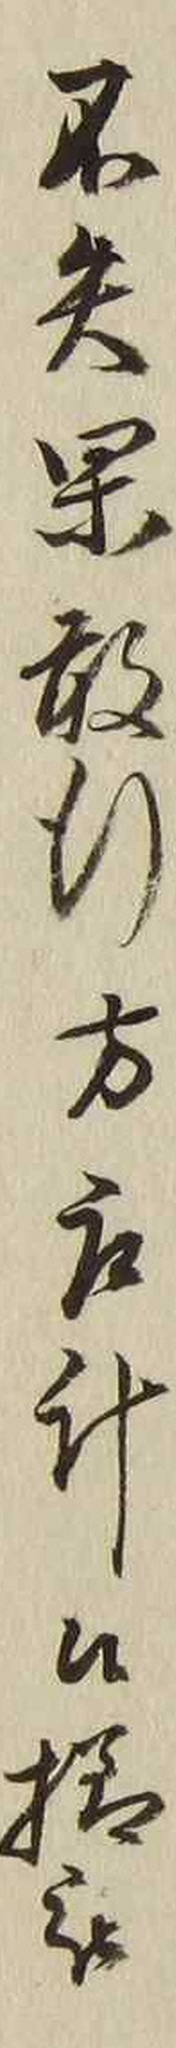不失果敢行方取計候様被
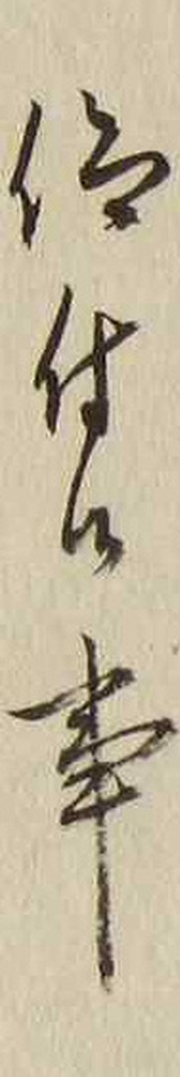仰付候事

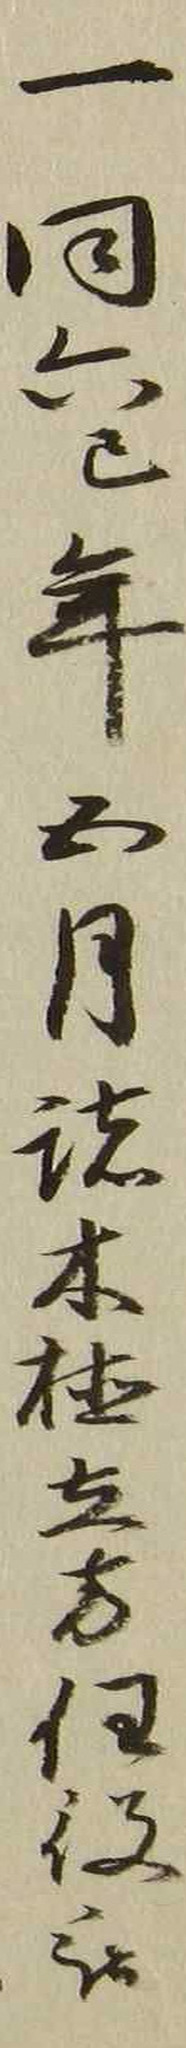一同六巳年五月諸木植立方任役被
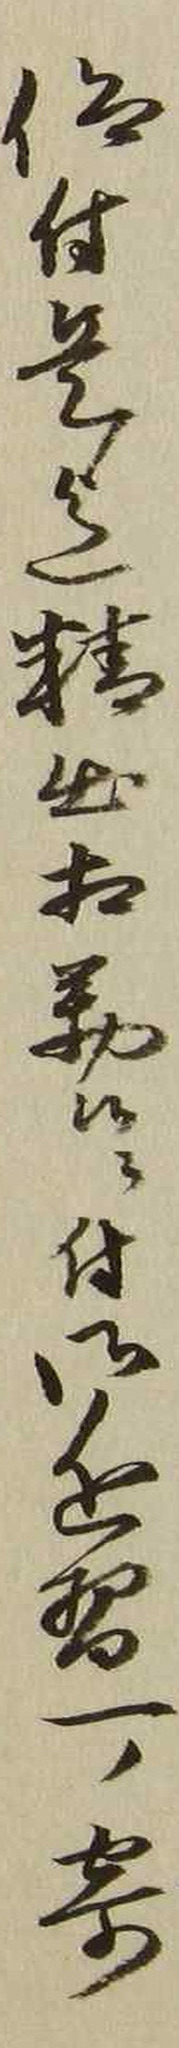仰付是迄精出相勤候ニ付御近習一ノ寄
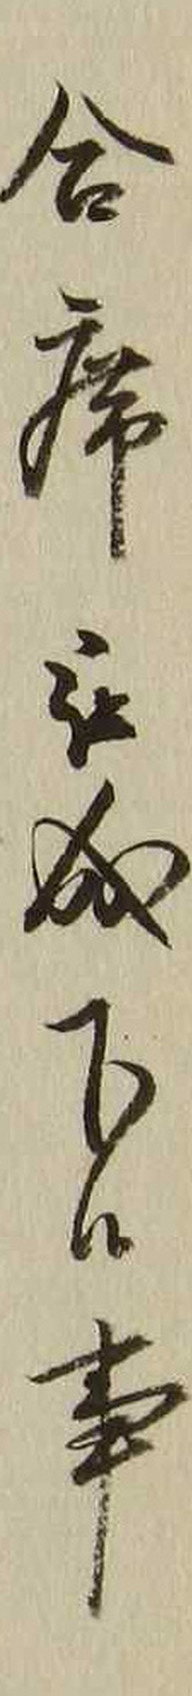合席被成下候事
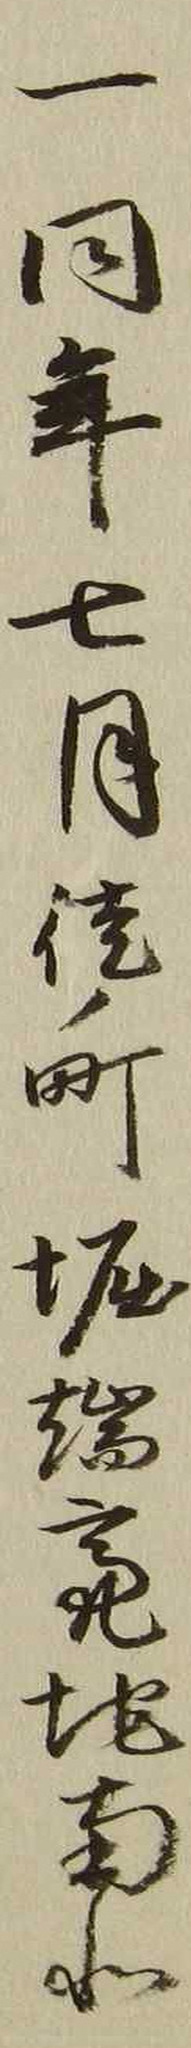一同年七月徒ノ町堀端竈地南北
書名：諸士系譜　巻之61　と之部4
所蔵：会津若松市立会津図書館
